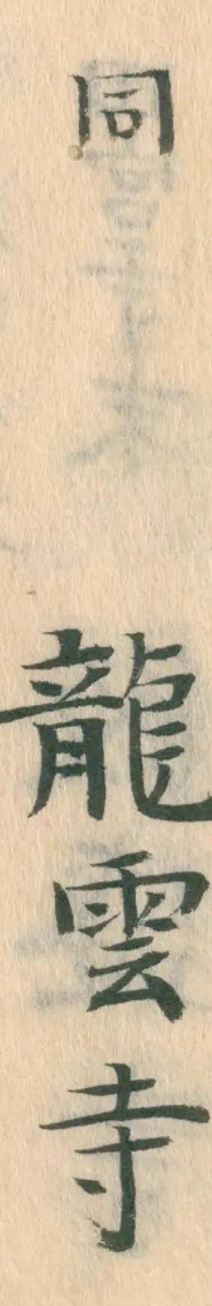同龍雲寺
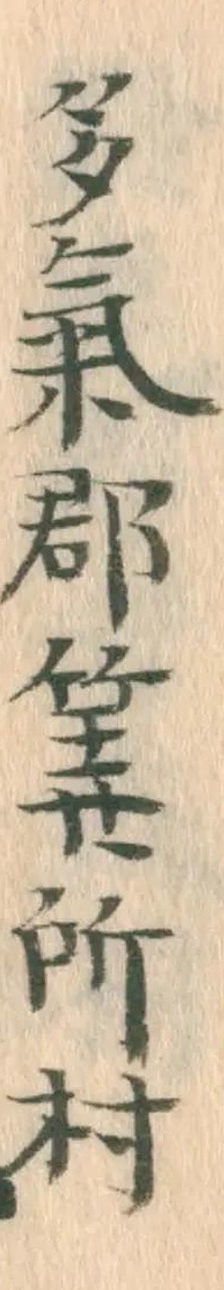多気郡算所村
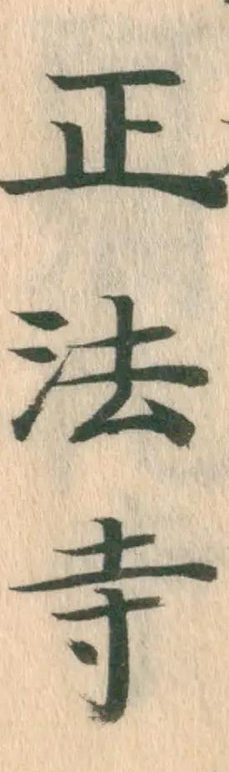正法寺
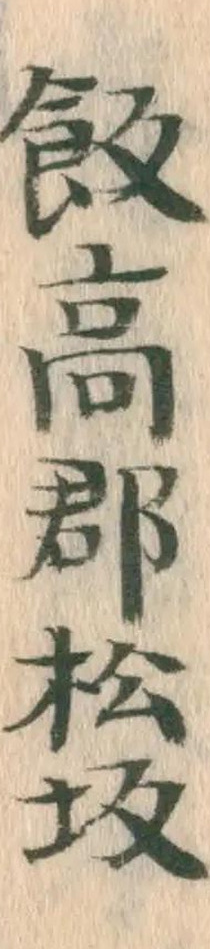飯高郡松坂
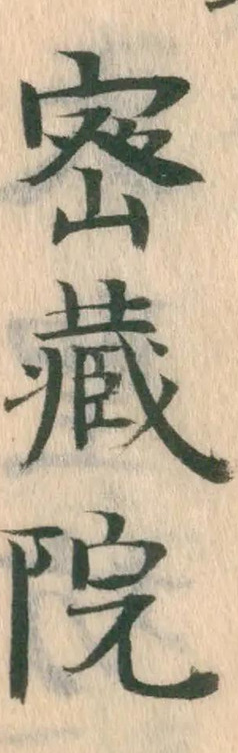密蔵院
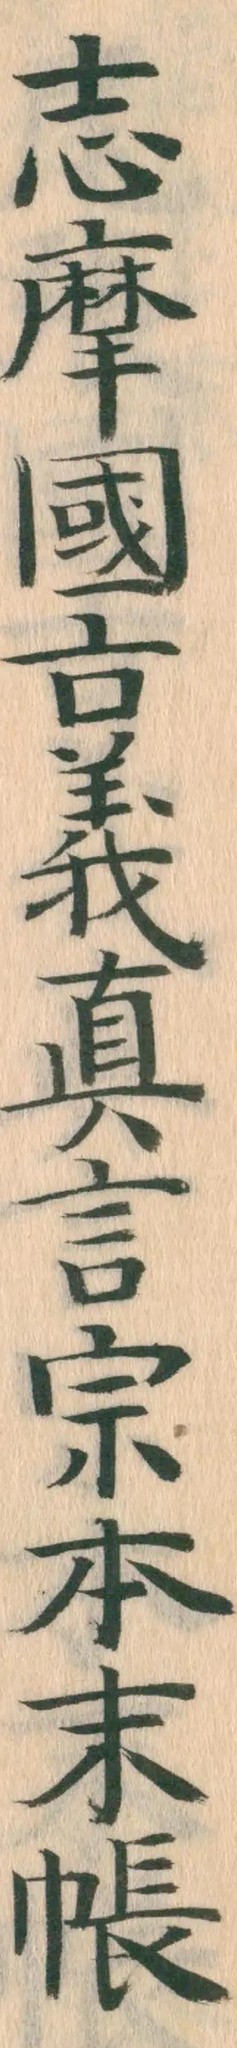志摩国古義真言宗本未帳

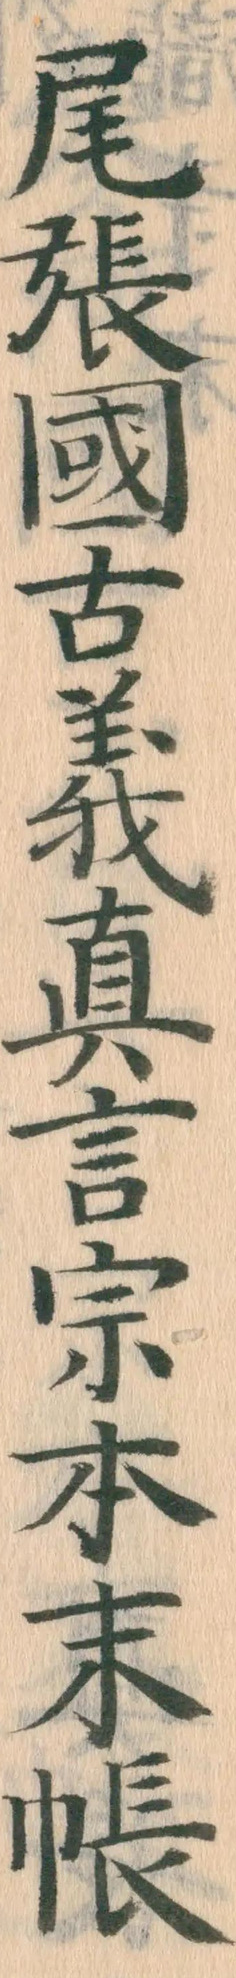尾張国古義真言宗本未帳
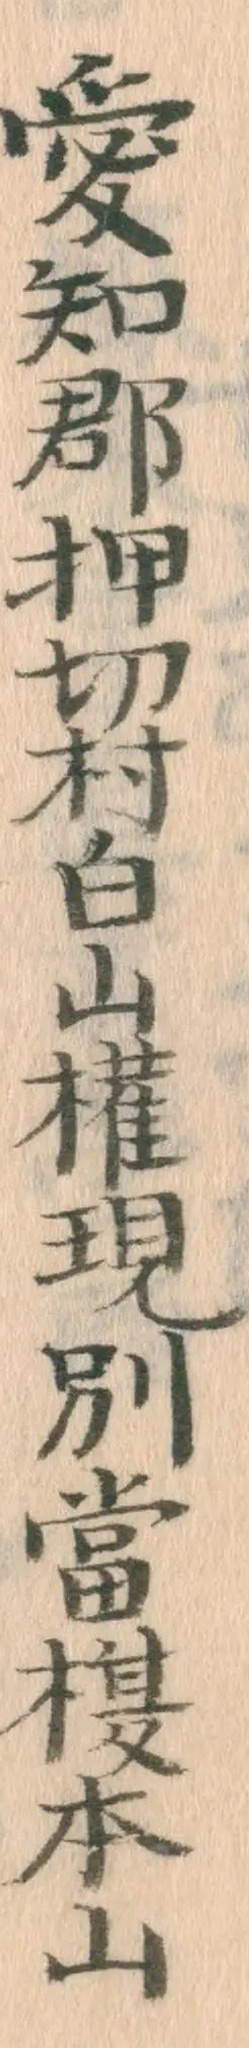愛知郡押切村白山権現別当榑本山
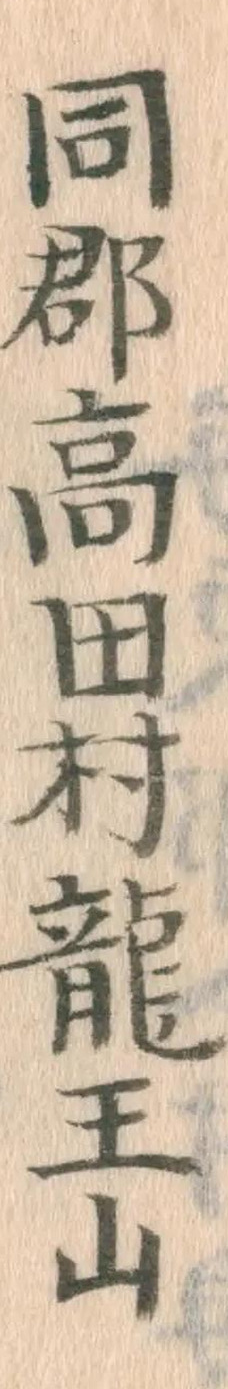同郡高田村龍王山
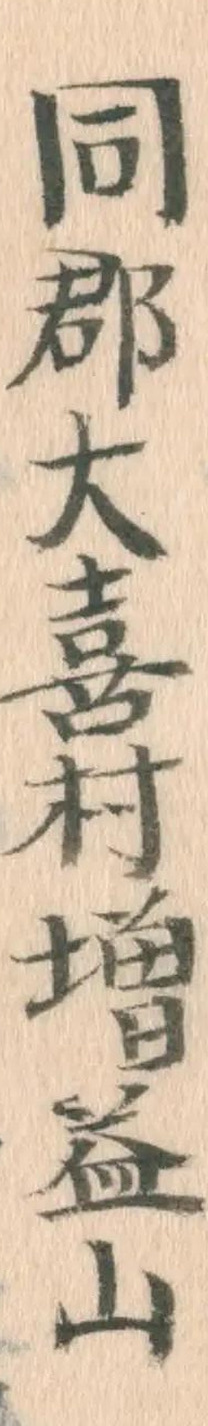同郡大喜村増益山

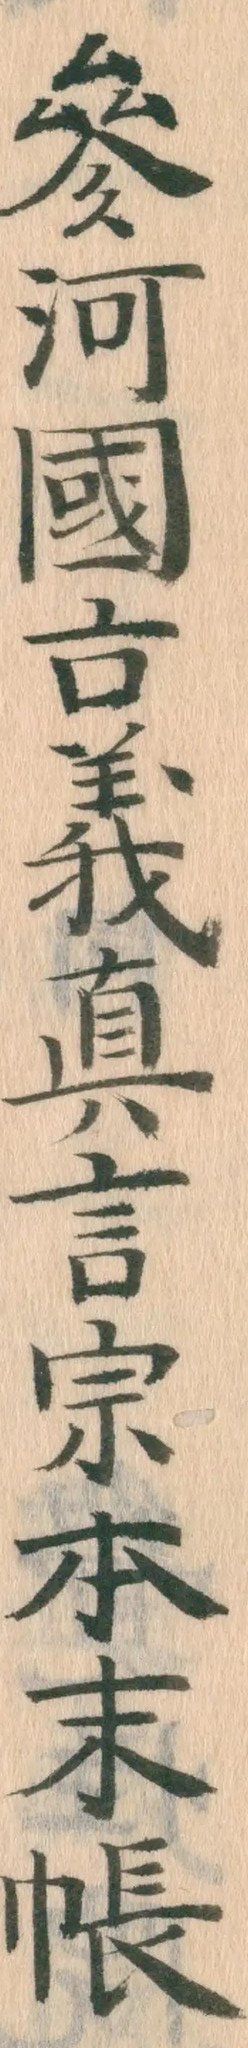参河国古義真言宗本未帳
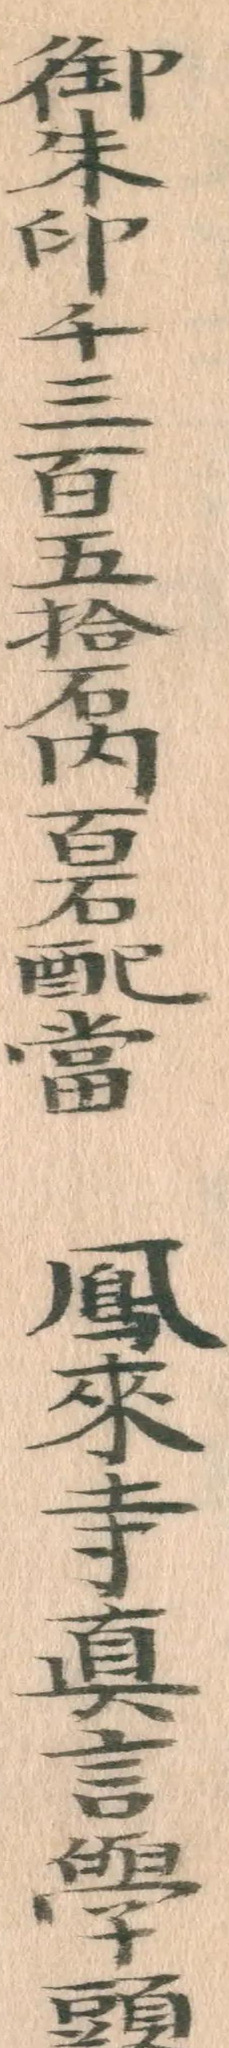御朱印千三百五拾石内百石配当鳳来寺真言学頭
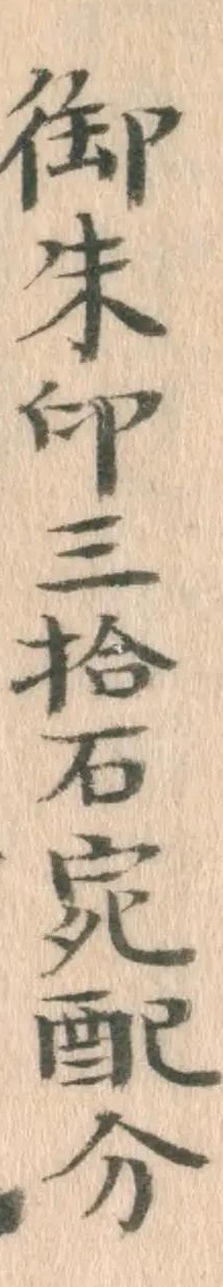御朱印三拾石宛配分
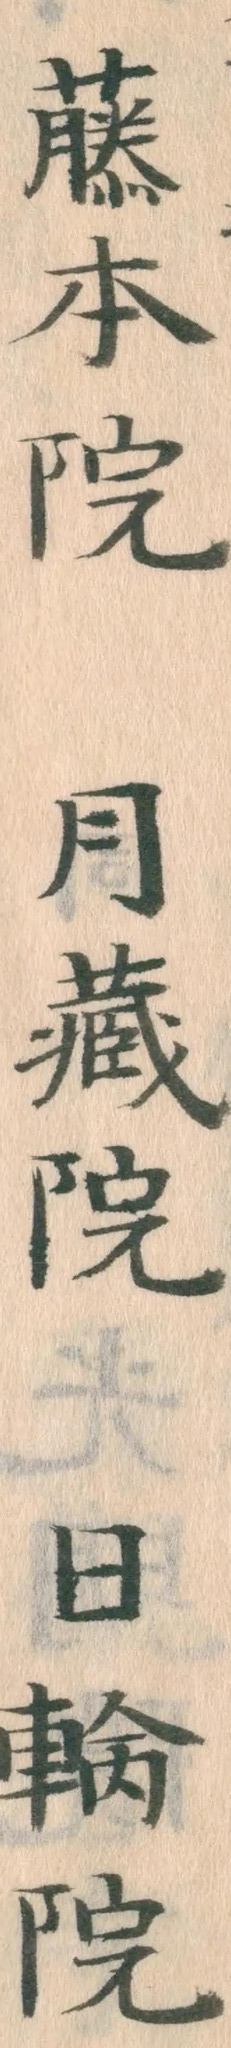藤本院月蔵院日輪院
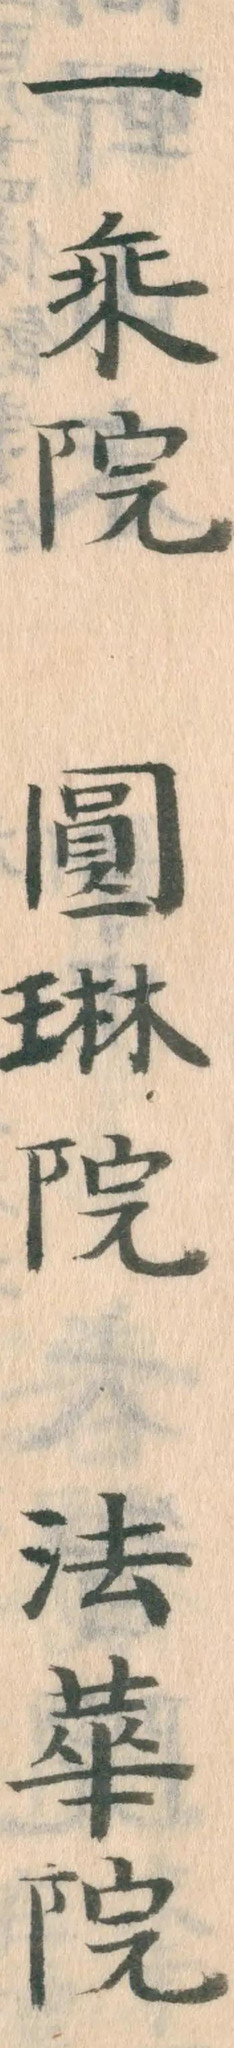一乗院圓琳院法華院

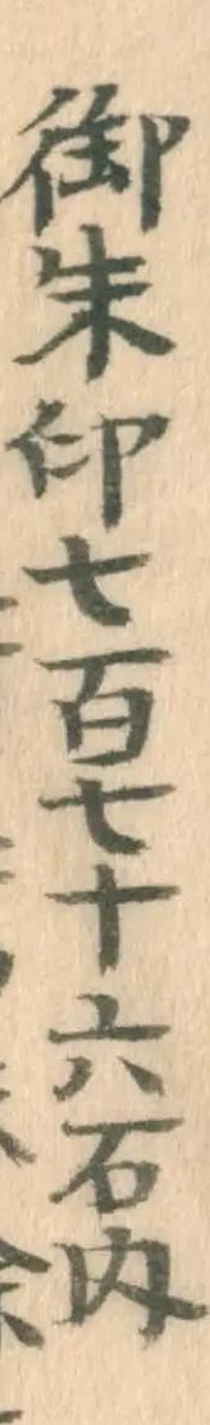御朱印七百七十六石
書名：古義真言宗本末帳 21巻. [4] 第三 伊賀国、伊勢国、志摩国、尾張国、三河国、遠江国、駿河国、伊豆国、甲斐国
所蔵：国立国会図書館 National Diet Library, JAPAN
